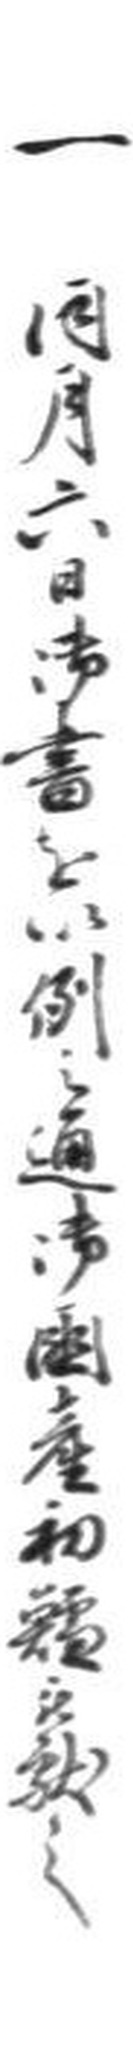一同月六日御書を以例之通御国産初鱈被献之
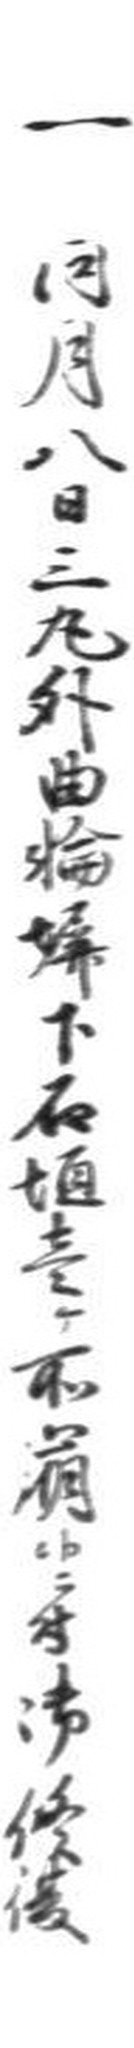一同月八日三丸外曲輪并下石垣壱ケ所崩候ニ付御修復
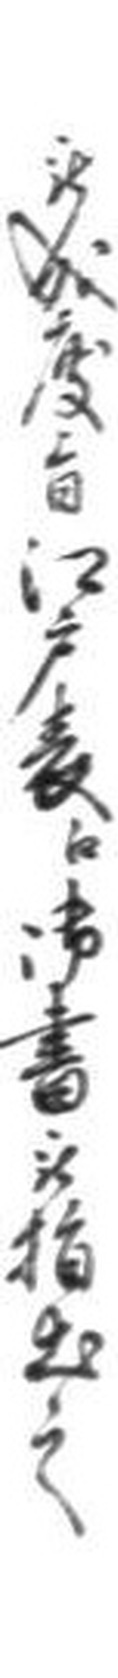被成度旨江戸表江御書被指出之

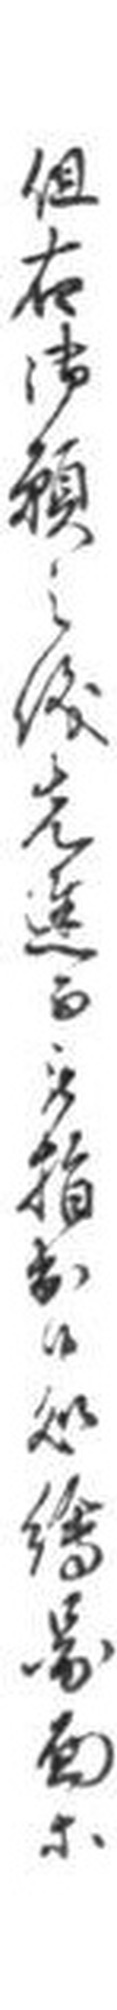但右御願之儀先達而被指出候処絵図面等
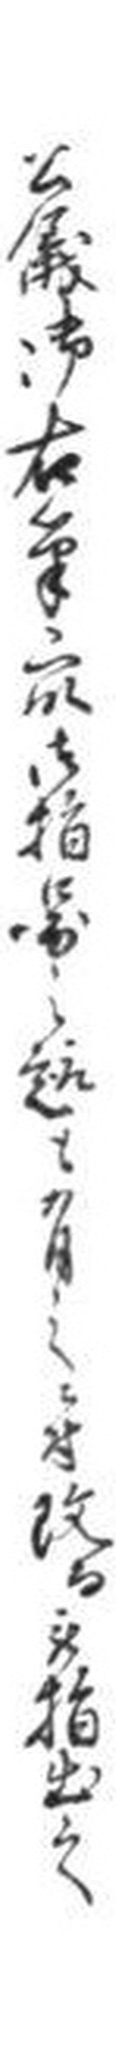公儀御右筆衆御指図之趣も有之ニ付改而被指出之
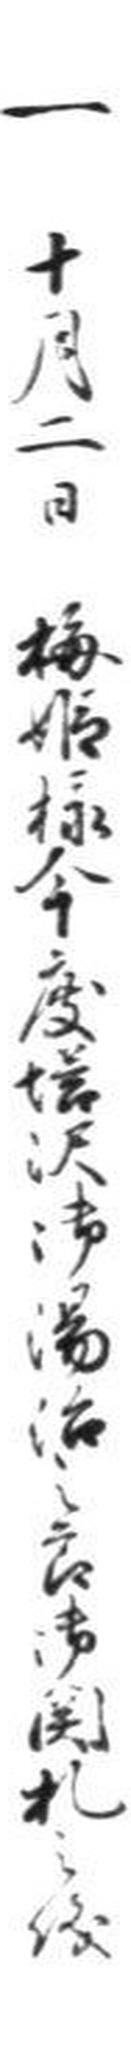一十月二日梅姫様今度塔沢御湯治之節御関札之儀
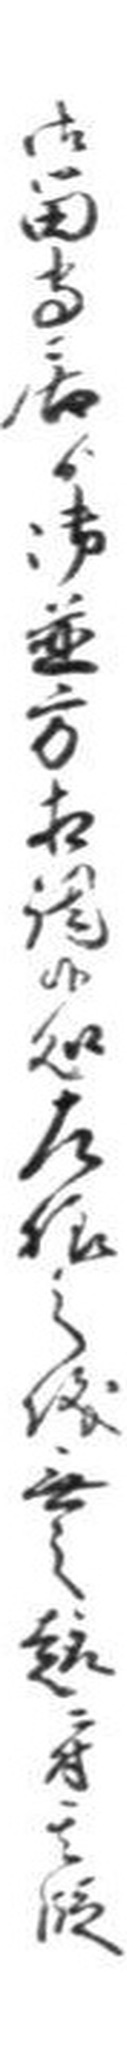御留守居ゟ御並方相調候処左様之儀無之趣ニ付其段
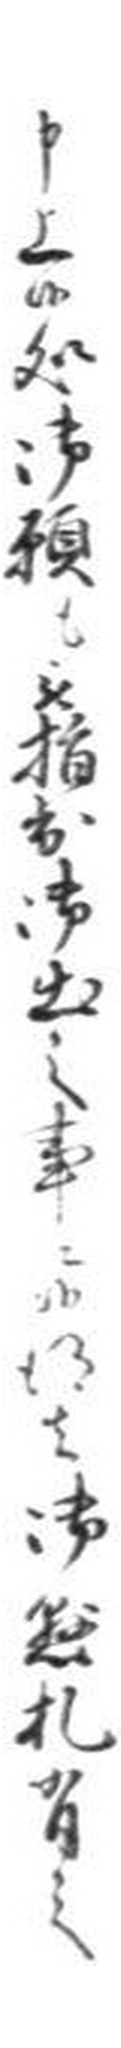申上候処御願も被指出御出之事ニ候得者御懸札有之
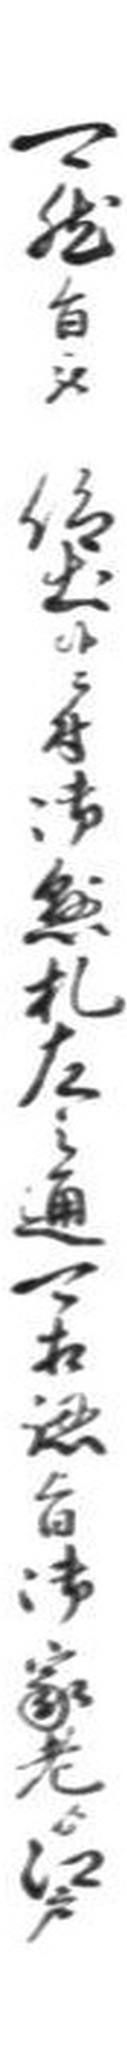可然旨被仰出候ニ付御懸札左之通可相認旨御家老ゟ江戸
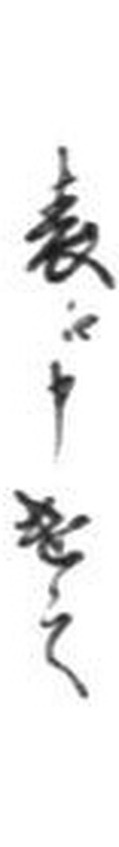表江申遣之
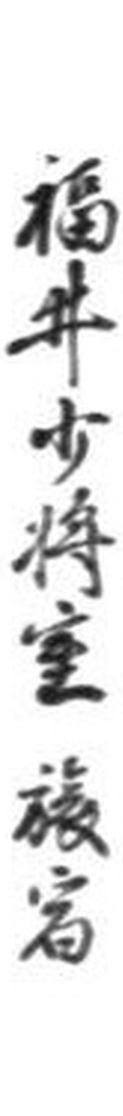福井少将室旅宿
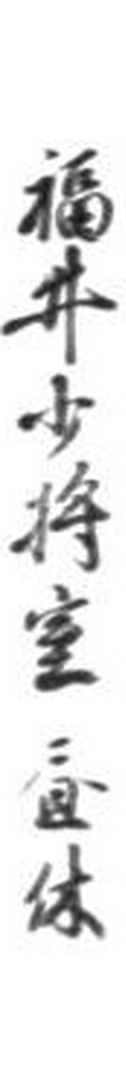福井少将室昼休
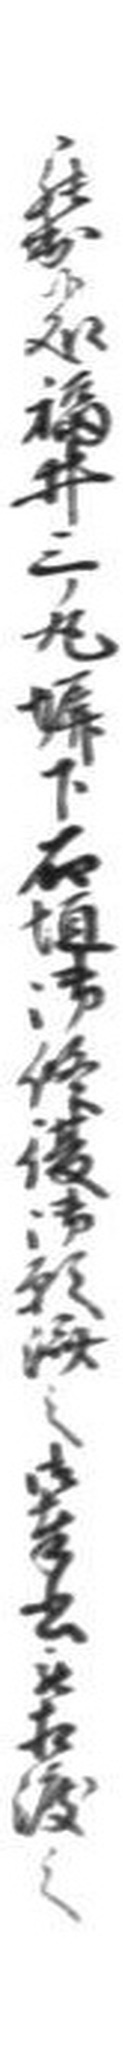罷出候処福井三ノ丸塀下石垣御修復御願済之御奉書被相渡之
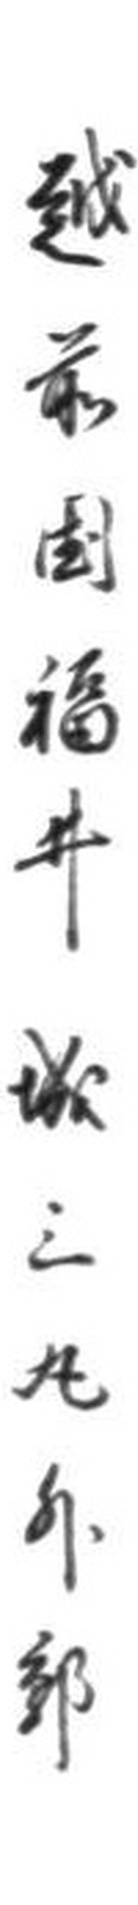越前国福井城三丸外郭
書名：家譜 三十三 吉邦公 享保四年
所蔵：福井県文書館 Fukui Prefectural Archives
